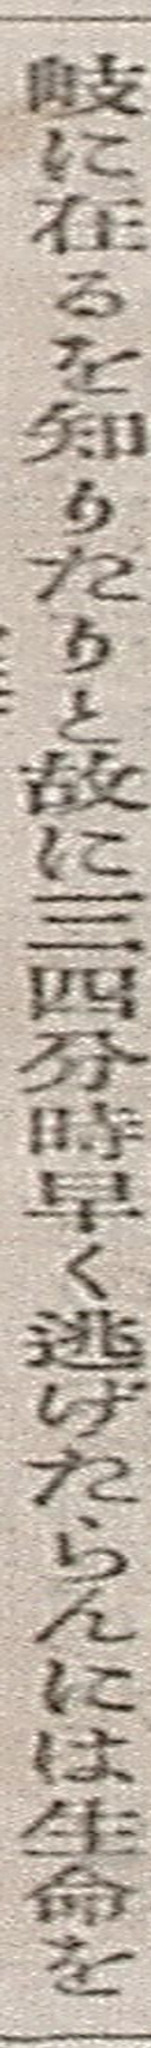岐に在るを知りたりと故に三四分時早く逃げたらんには生命を
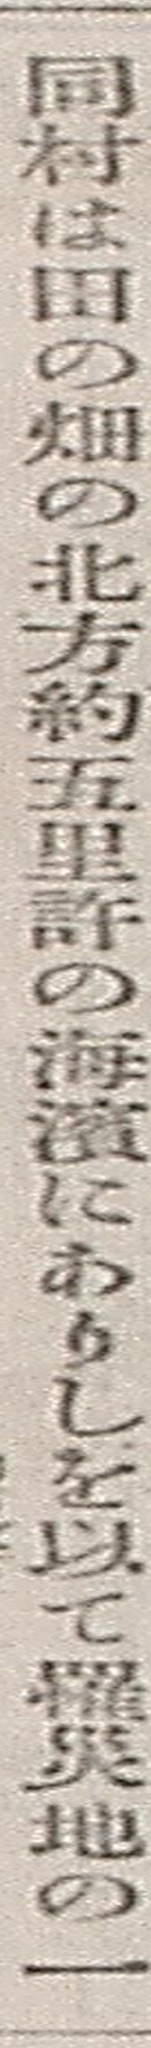同村は田の畑の北方約五里許の海浜にありしを以て罹災地の一
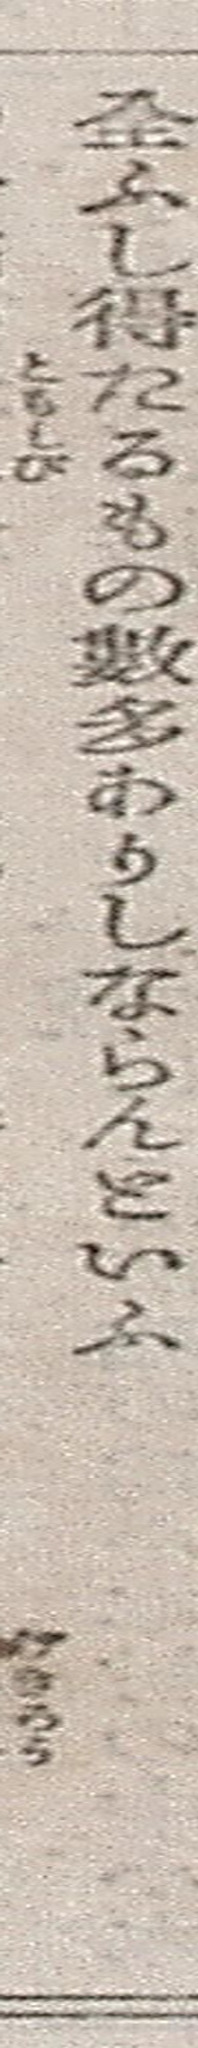全ふし得たるもの数多ありしならんといふ
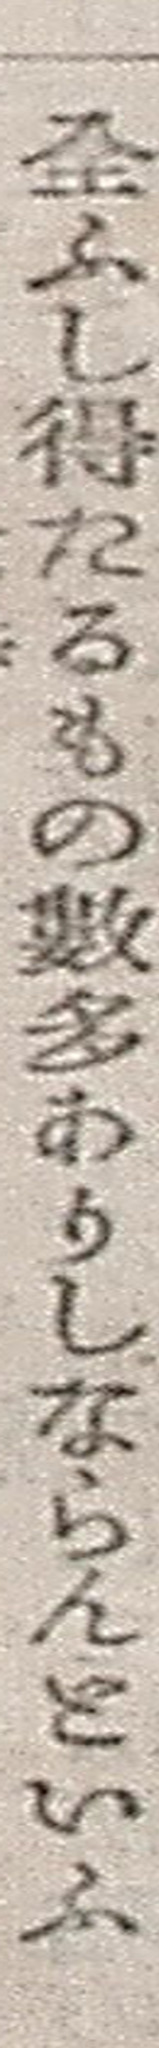全ふし得たるもの数多ありしならんといふ
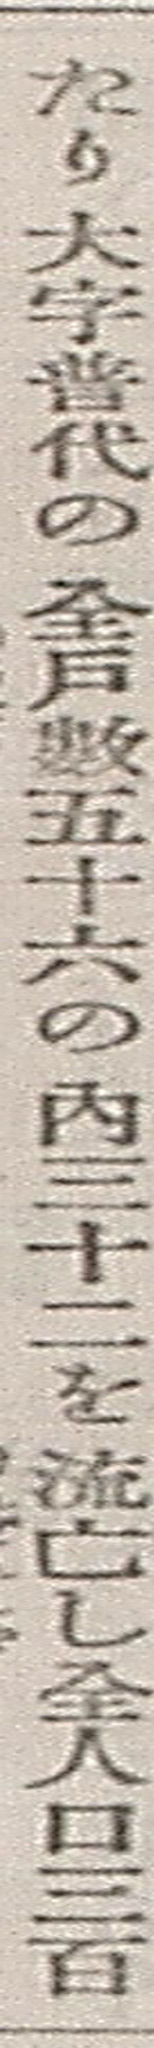たり大字普代の全戸数五十六の内三十二を流亡し全人口三百
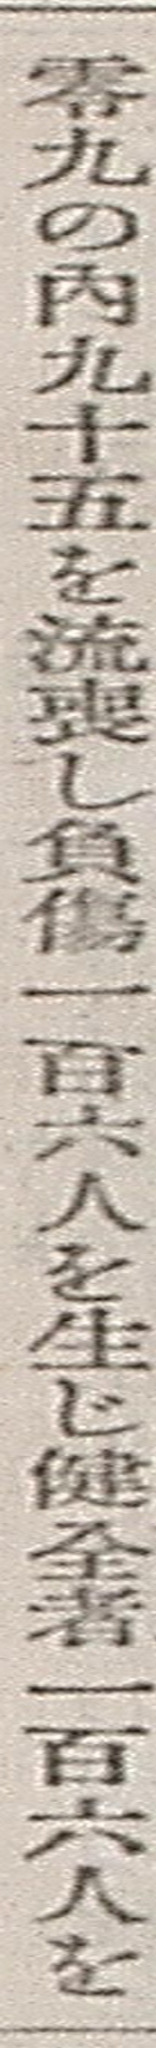零九の内九十五を流喪し負傷一百六人を生じ健全者一百六人を
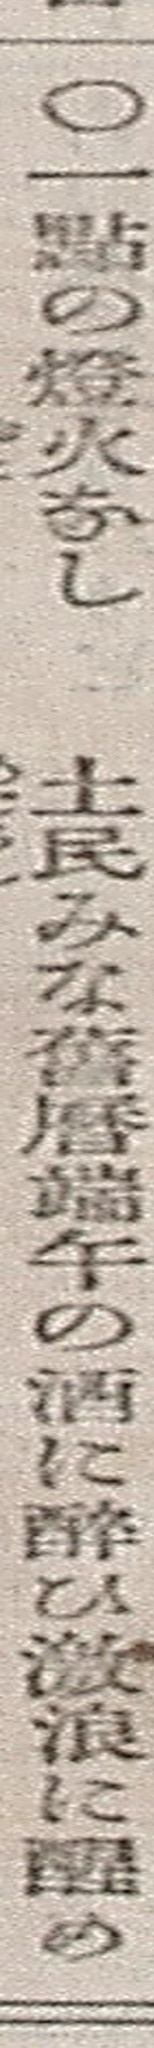〇一点の燈火なし土民みな旧暦端午の酒に酔ひ激浪に醒め
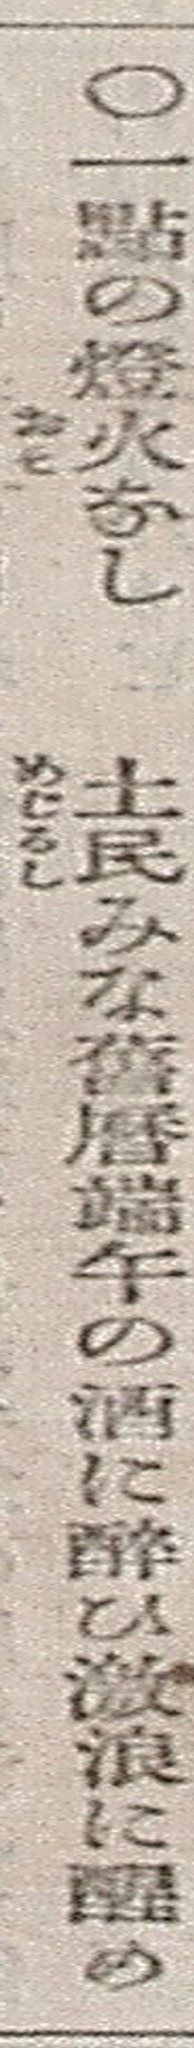〇一点の燈火なし土民みな旧暦端午の酒に酔ひ激浪に醒め
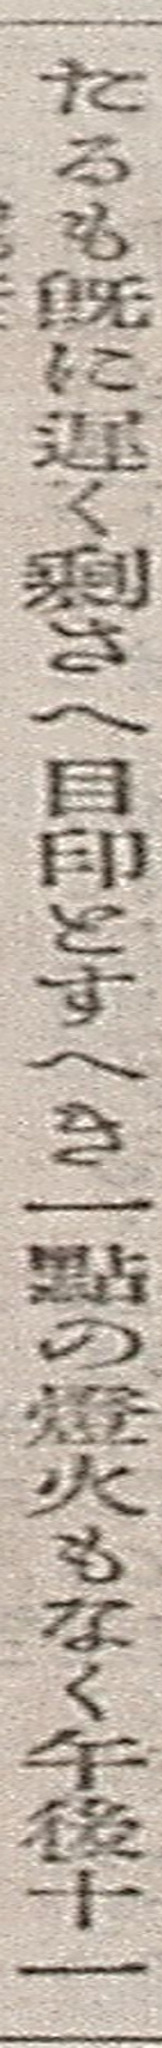たるも既に遅く剰さへ目印とすへき一点の燈火もなく午後十一
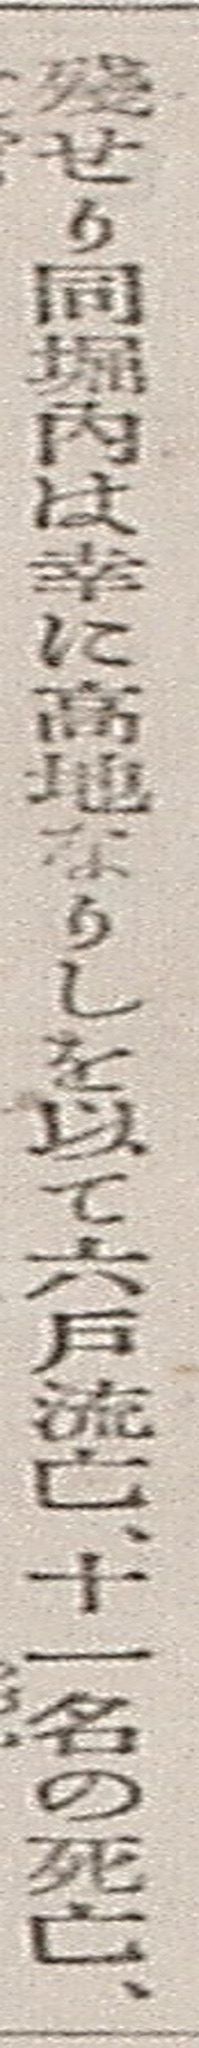残せり同堀内は幸に高地なりしを以て六戸流亡、十一名の死亡、
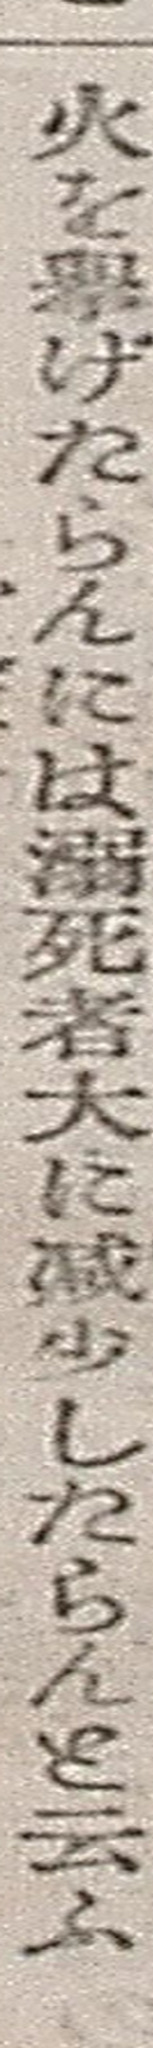火を挙げたらんには溺死者大に減少したらんと云ふ
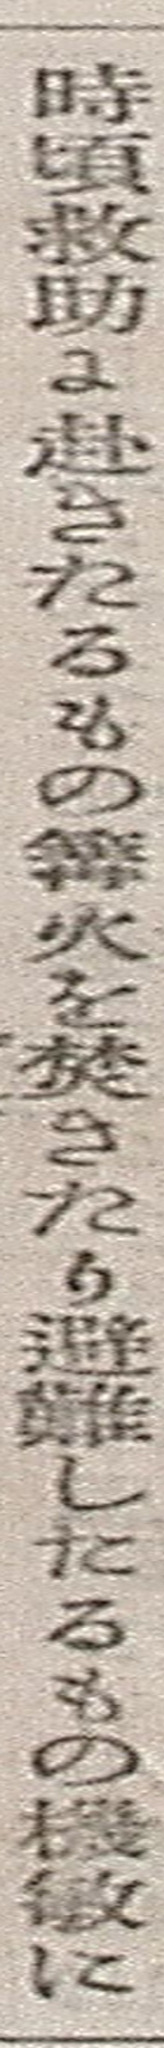時頃救助に赴きたるもの篝火を焚きたり避難したるもの機敏に
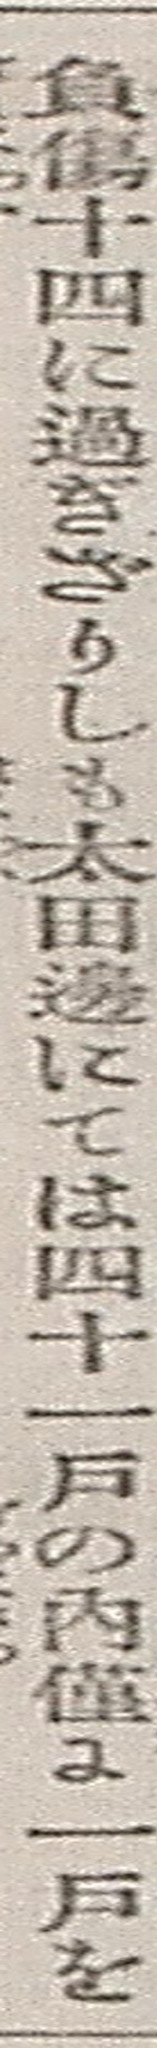負傷十四に過ぎざりしも太田辺にては四十一戸の内僅に一戸を
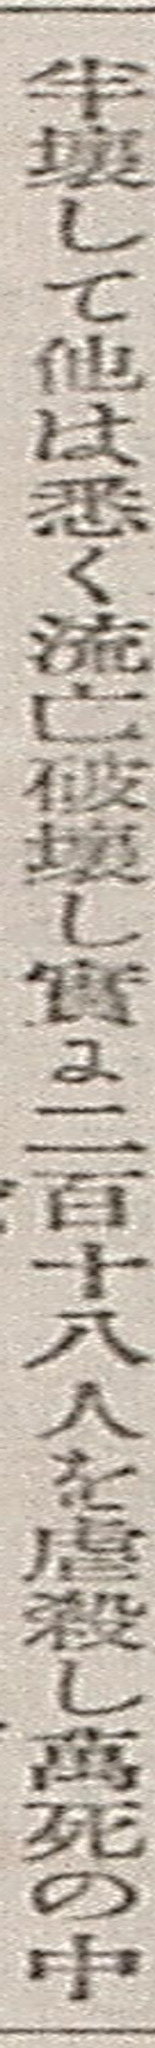半壊して他は悉く流亡破壊し実に二百十八人を虐殺し万死の中
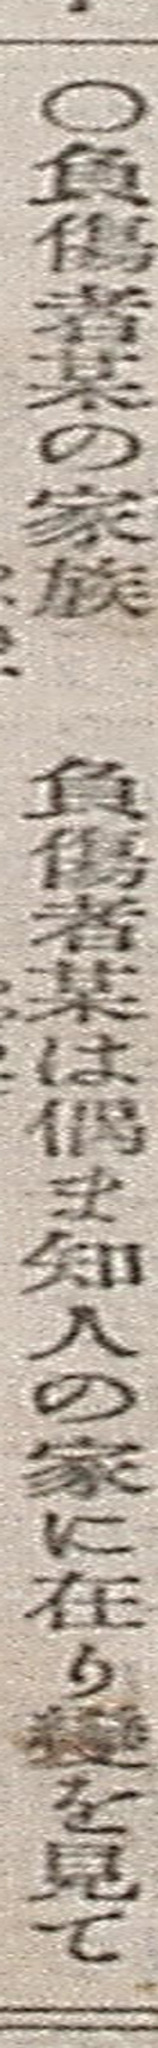〇負傷者某の家族負傷者某は偶ま知人の家に在り変を見て
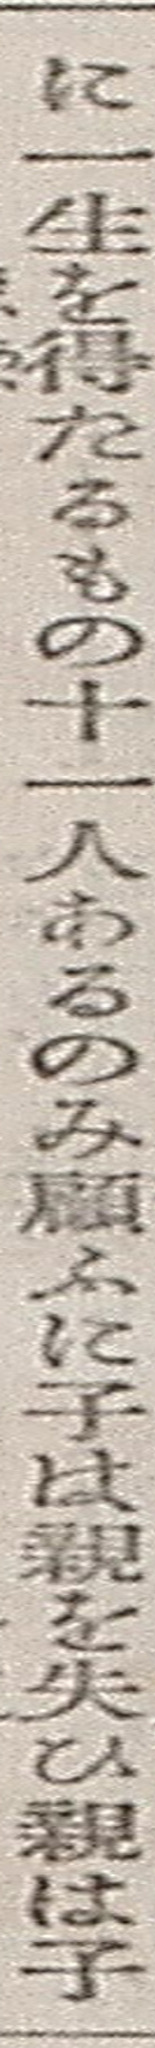に一生を得たるもの十一人あるのみ顧ふに子は親を失ひ親は子
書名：風俗畫報臨時増刊第百十九號　大海嘯被害録（中）
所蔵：東京大学地震研究所図書室 Earthquake Research Institute Library, The University of Tokyo, JAPAN
